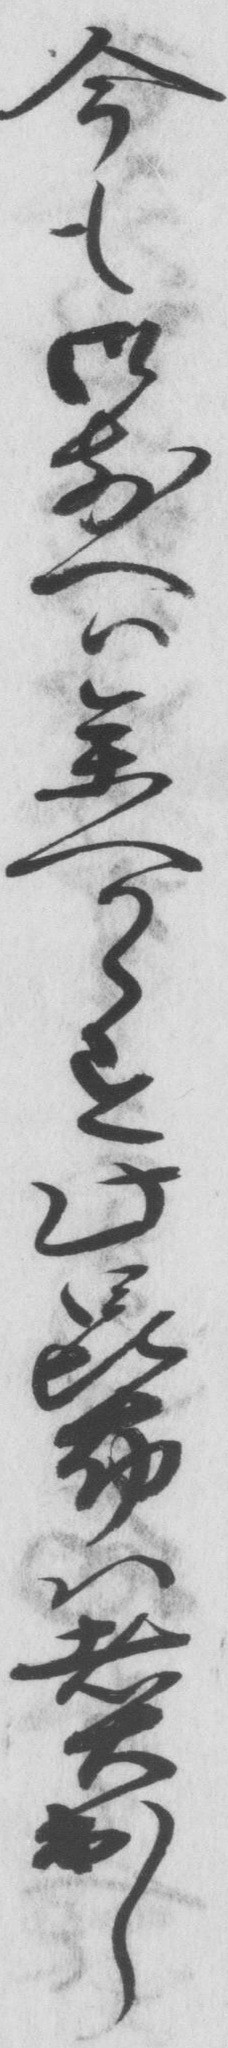今も御前へは参へからす此昆布は煮出し
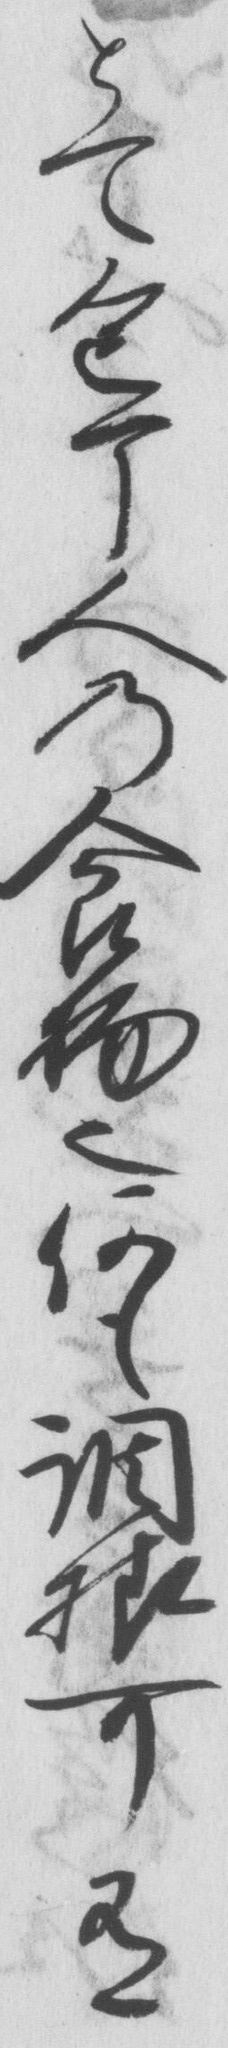とて包丁人の食物也何も調様可有
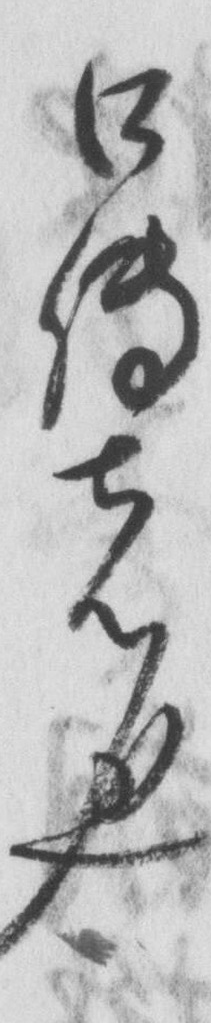口伝者也
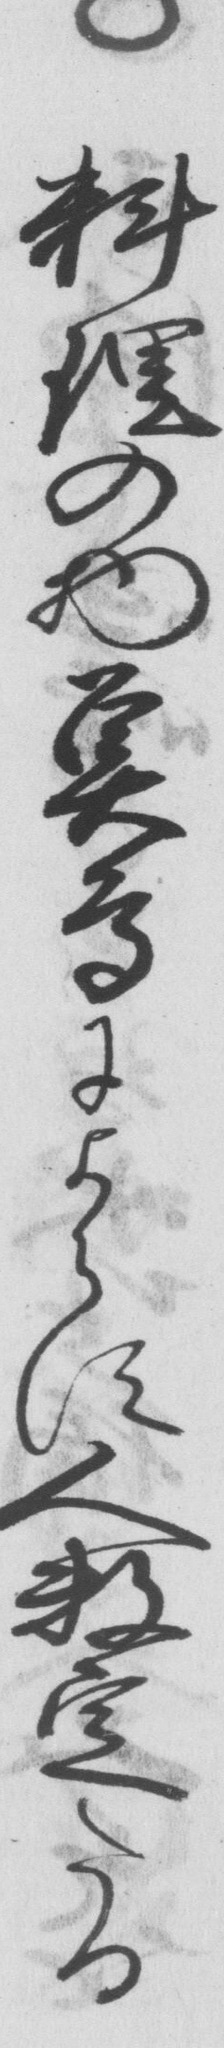一○料理の物魚鳥によらす人数定たる
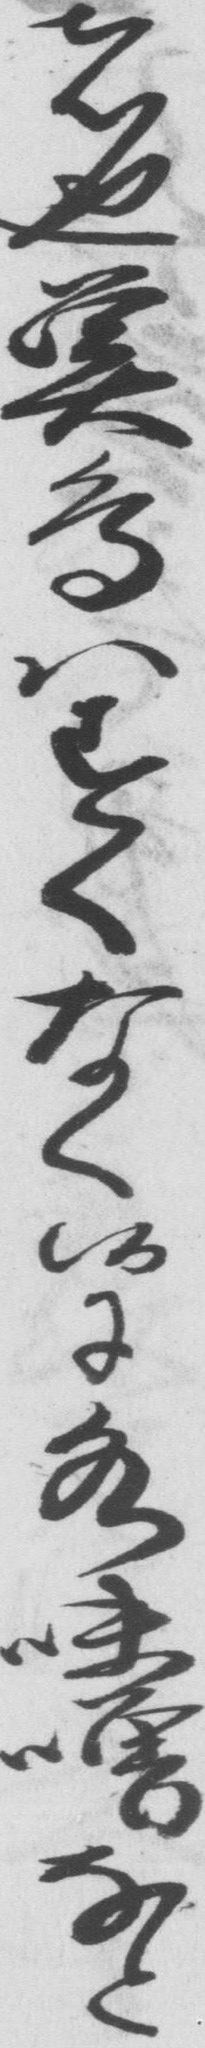者也魚鳥はすくなく候に水味噌なと
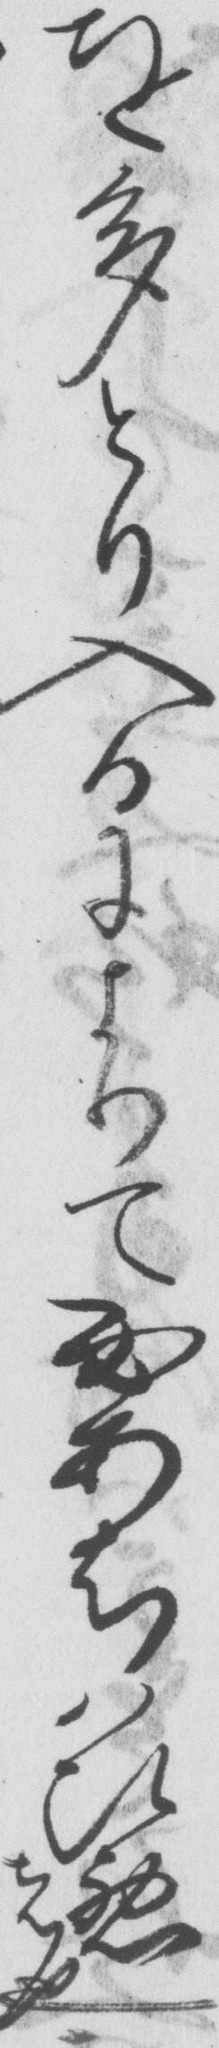を多とり入るによりて必あちはひ悪者也
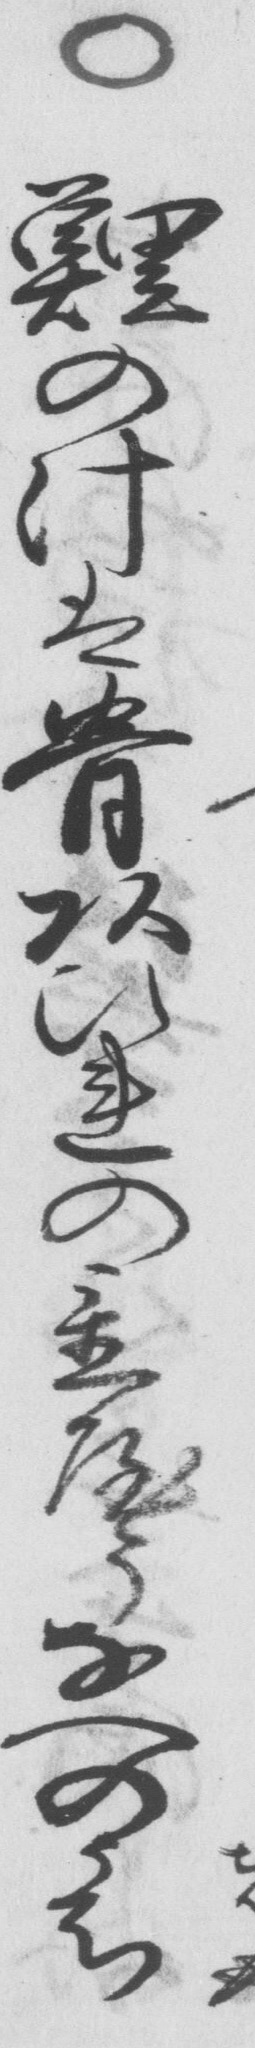一○鯉の汁は骨頭ひれの置やうなへのうち
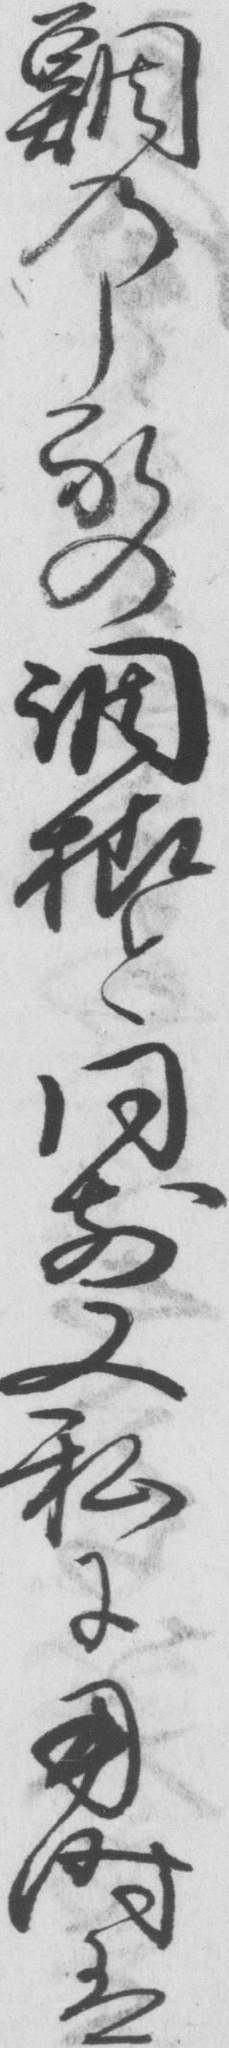鯛のしるの調様と同前又私に用時は
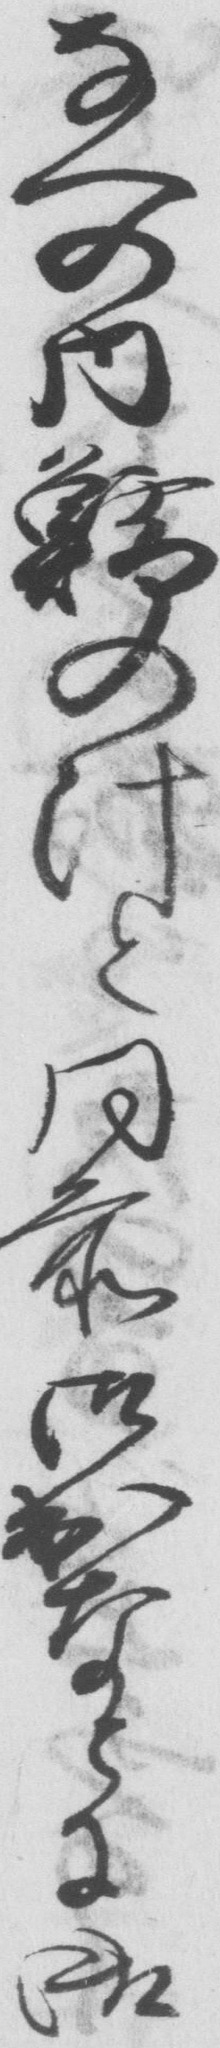なへの内鱈の汁と同前御出なとに御
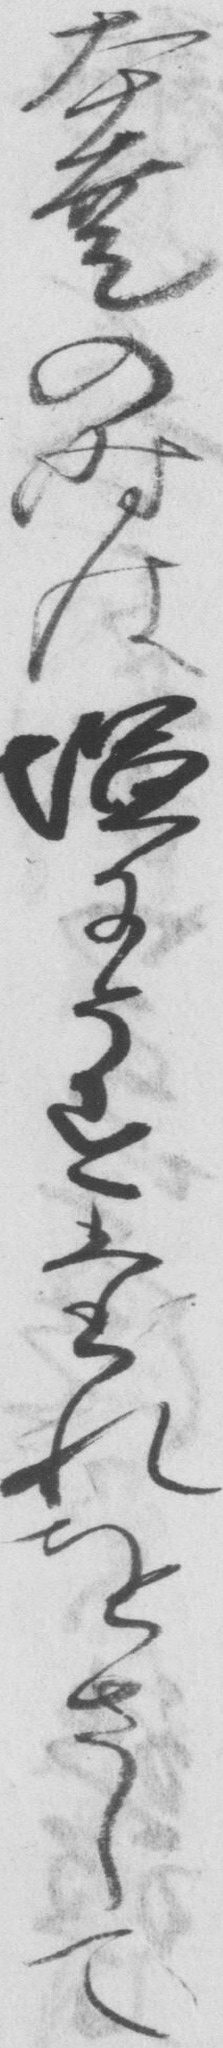本走の時は塩にうすたれをさして
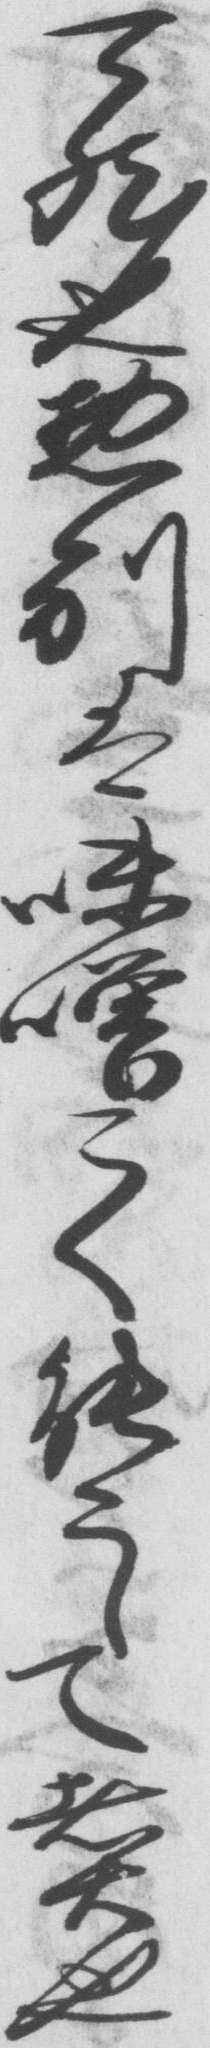可然也惣別は味噌こく能こして煮也
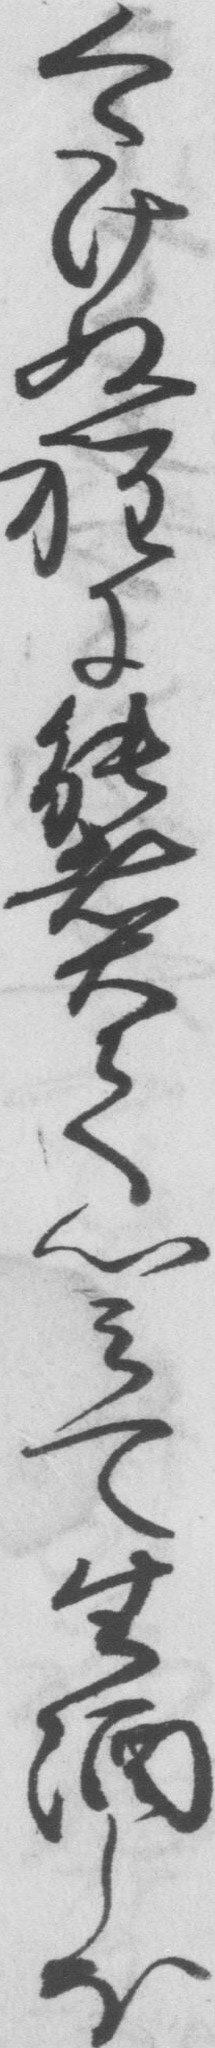くたけぬ程に能煮て心みて生酒しほ

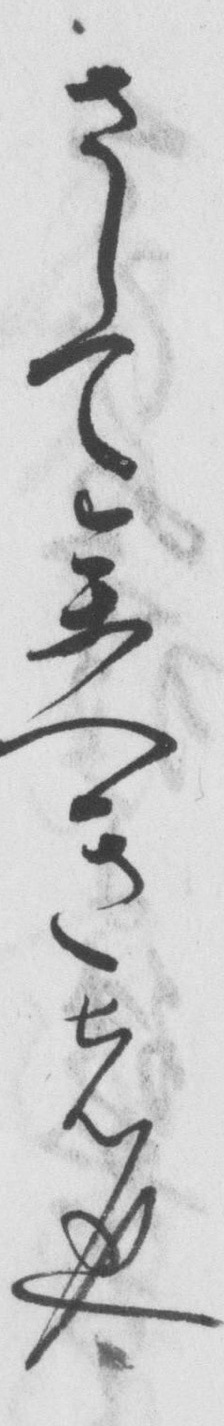さして参へき者也
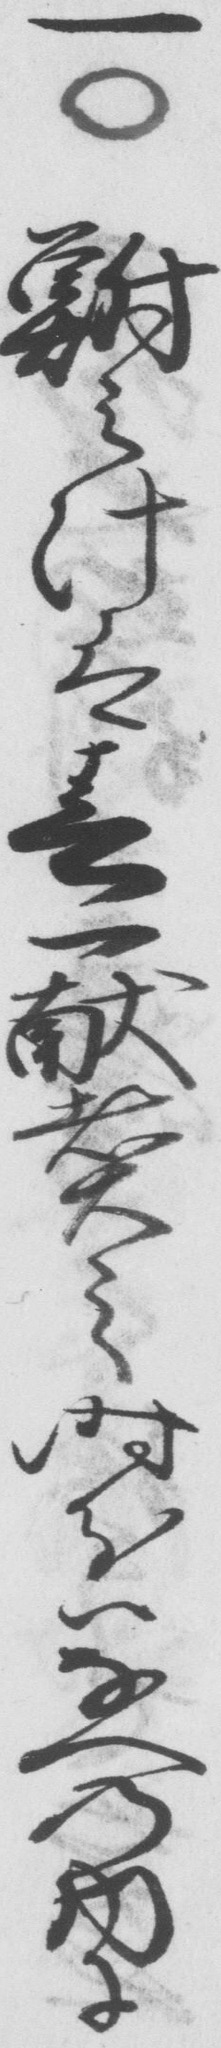一○鮒之汁は春一献煮之時分はなへの内に
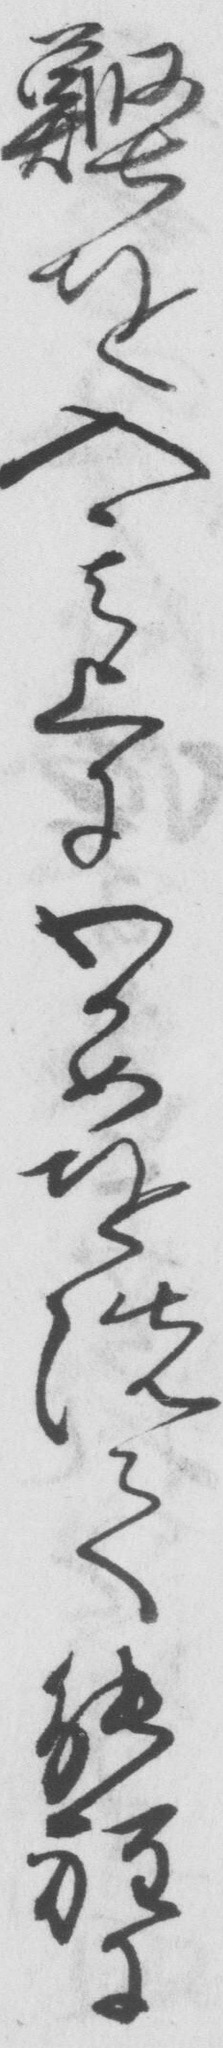鰹を入其上にわかめを洗て能程に
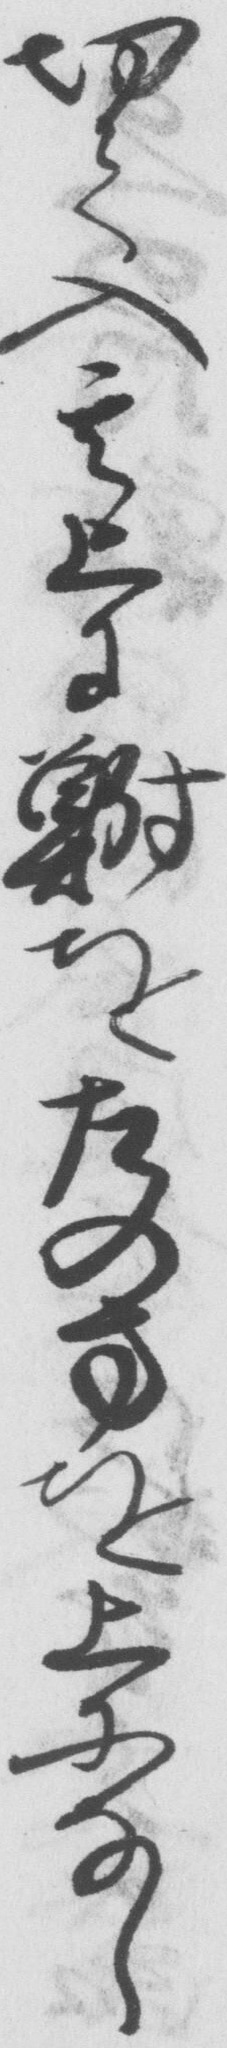切て入其上に鮒を左の方を上になし
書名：料理次第
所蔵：大阪府立大学学術情報センター 国文学研究資料館
